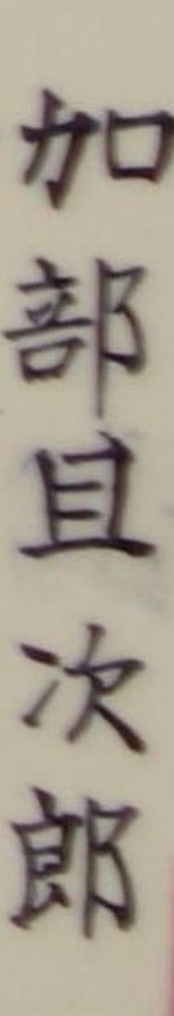加部且次郎
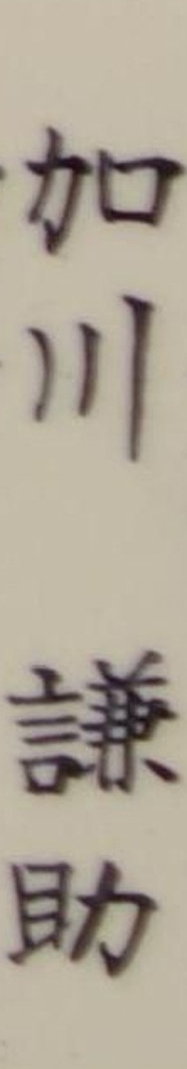加川謙助
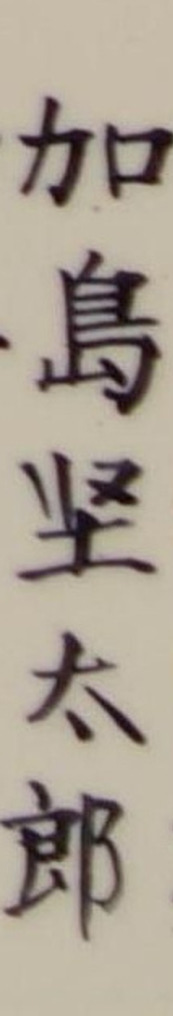加島堅太郎
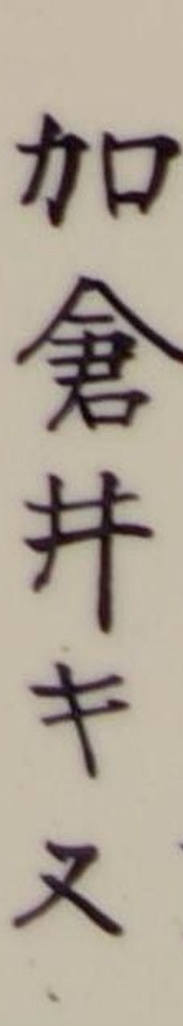加倉井キヌ
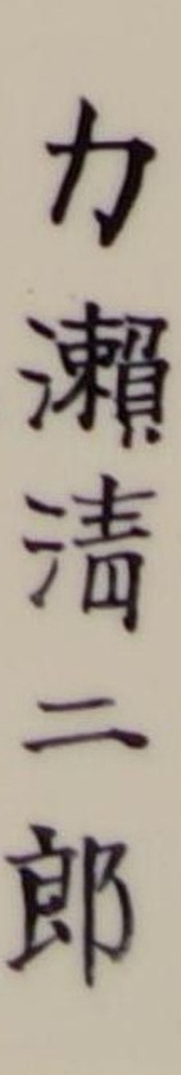力瀬清二郎
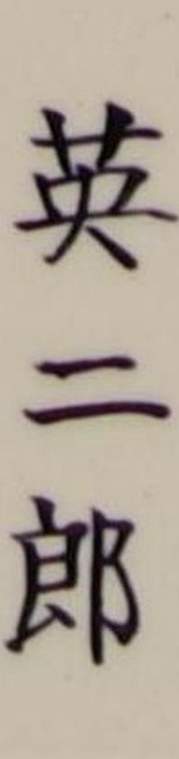英二郎
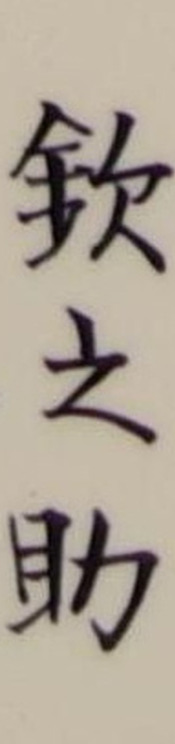欽之助
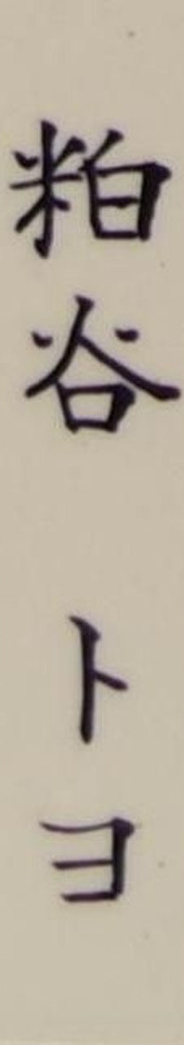粕谷トヨ
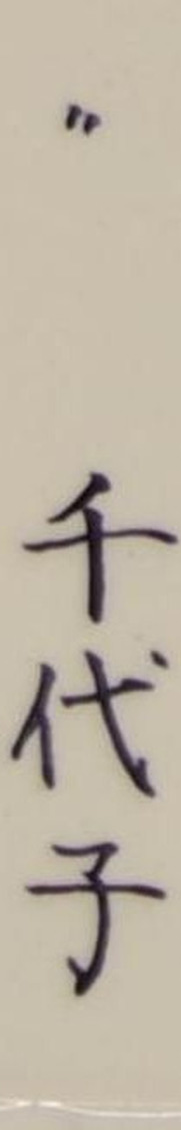千代子
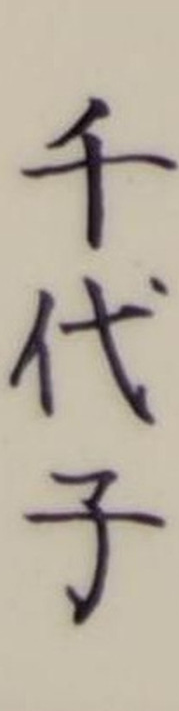千代子

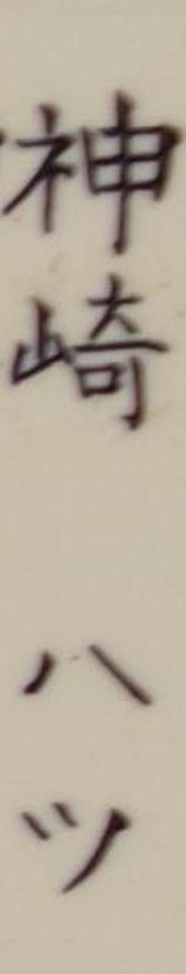神崎ハツ
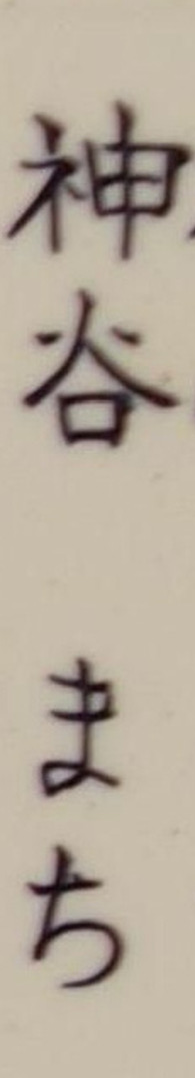神谷まち
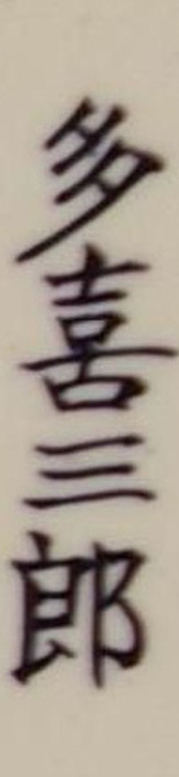多喜三郎
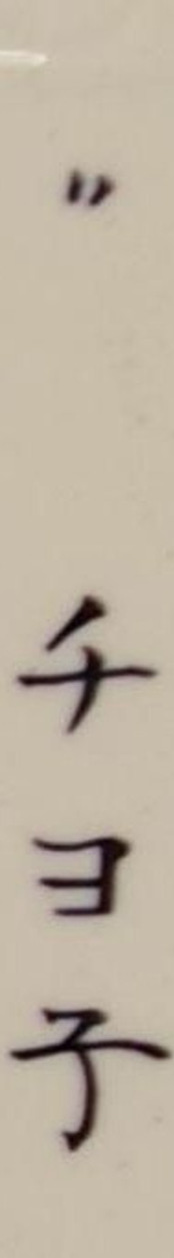チヨ子
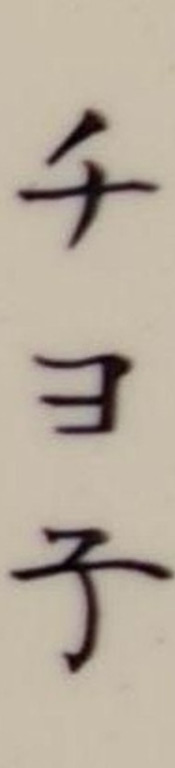チヨ子
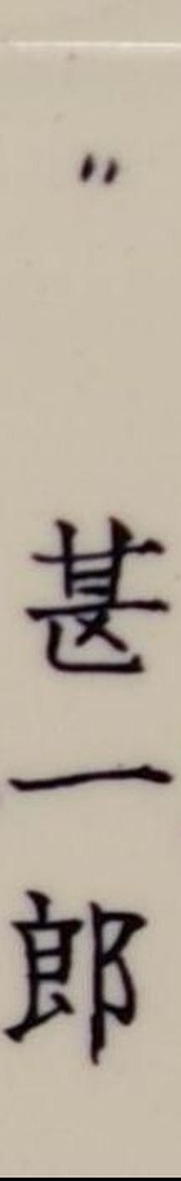甚一郎
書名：M~S
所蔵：高野山金剛峯寺
